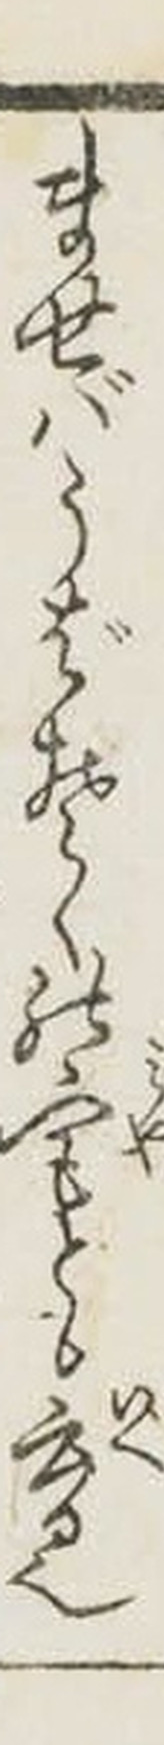ませばうばそくの宮とも云る也
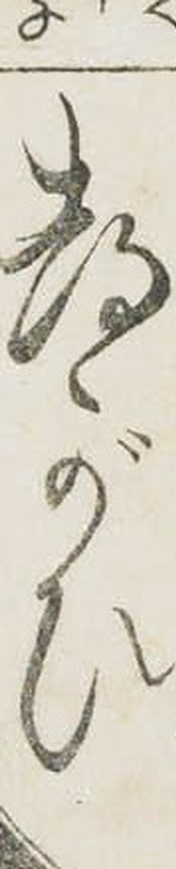つがひ
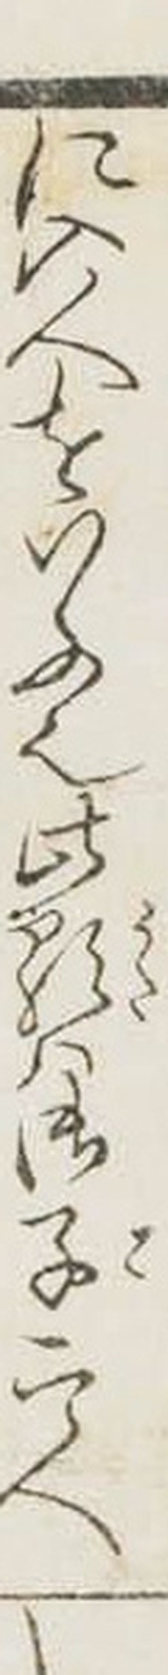に入人をいふ也此歌は御子二人
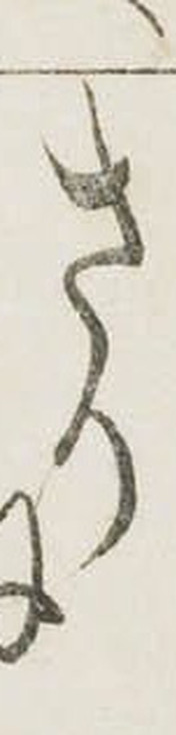さりに
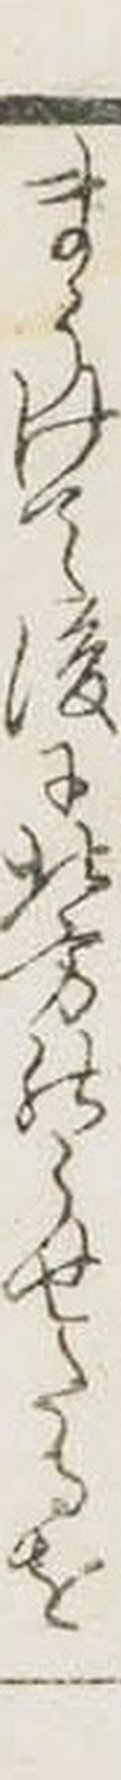まうけて後に北方のうせたるを
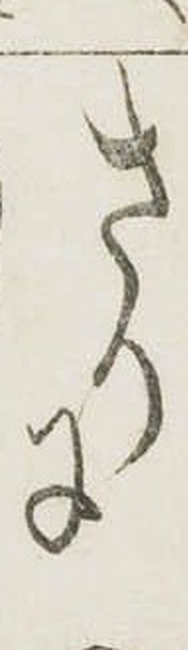さりに
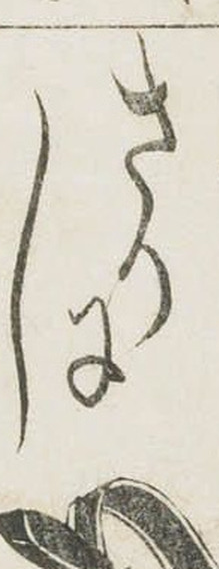さりに
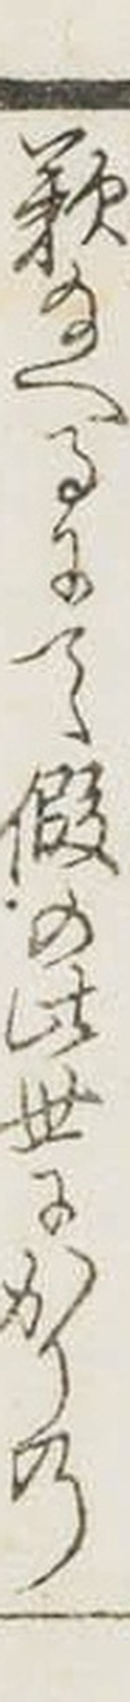歎給へるにて仮の此世にかりの
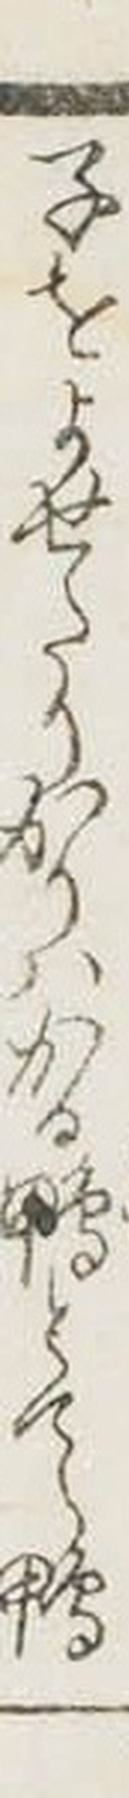子をよせたりかりはかる鴨とて鴨
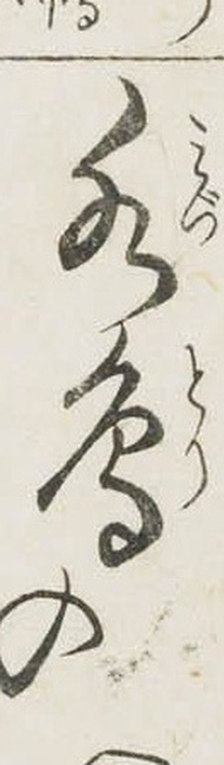水鳥の
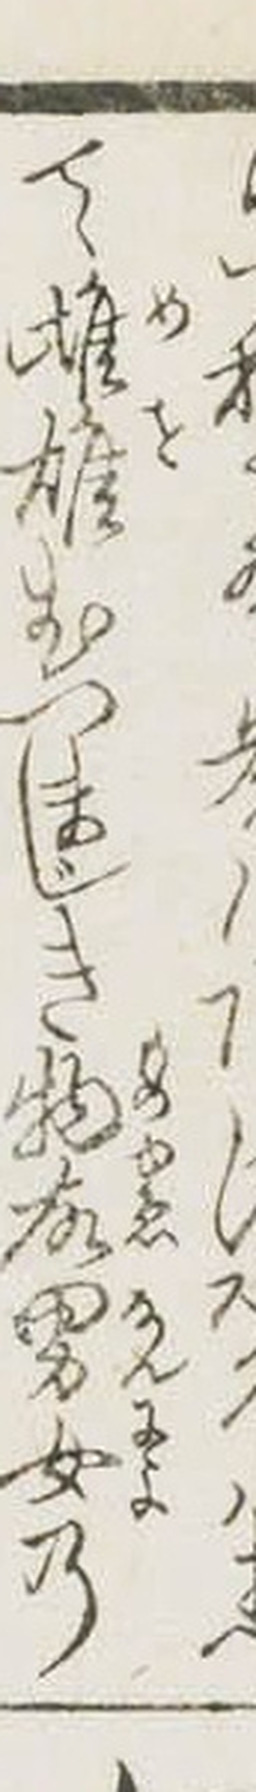て雌雄むつまじき物故男女の
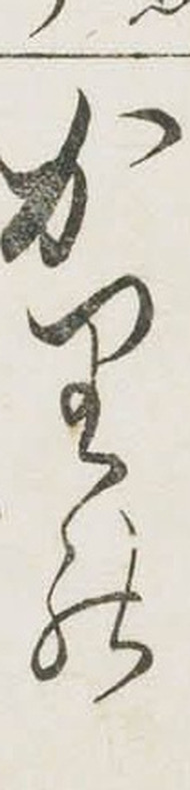かりの
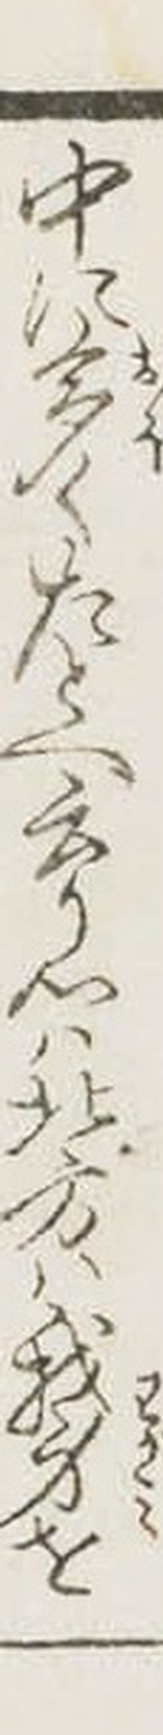中に多くたとへ云り心は北方は我身を
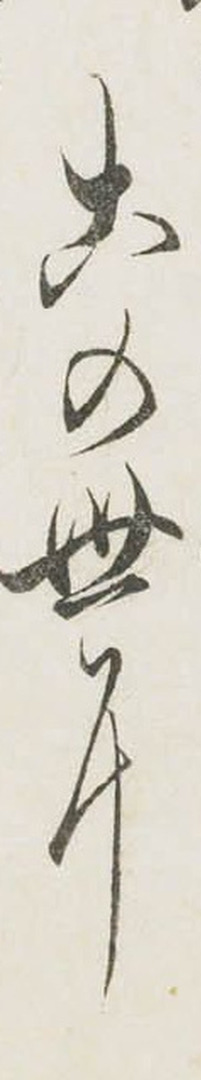この世に
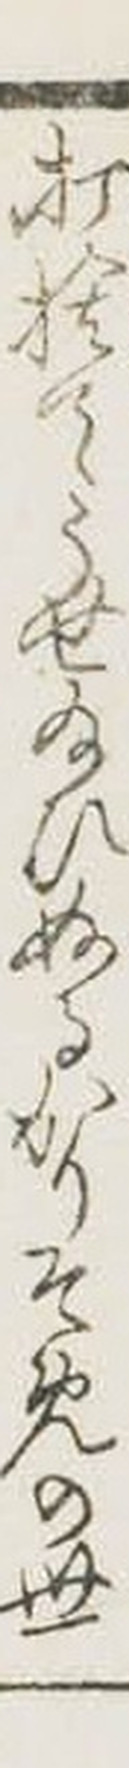打捨てうせ給ひぬるかりそめの世
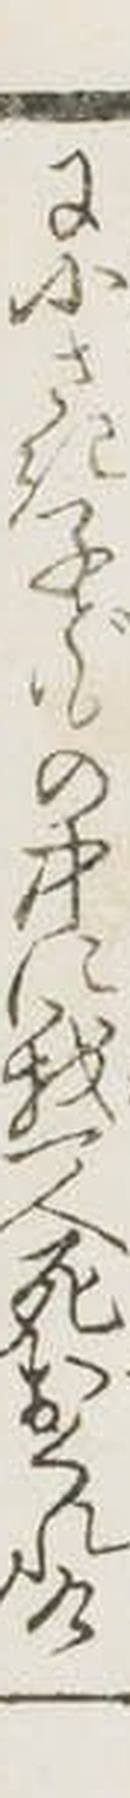に小さき子どもの中に我一人死おくれけ
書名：源氏百人一首
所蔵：東京学芸大学教育コンテンツアーカイブ
